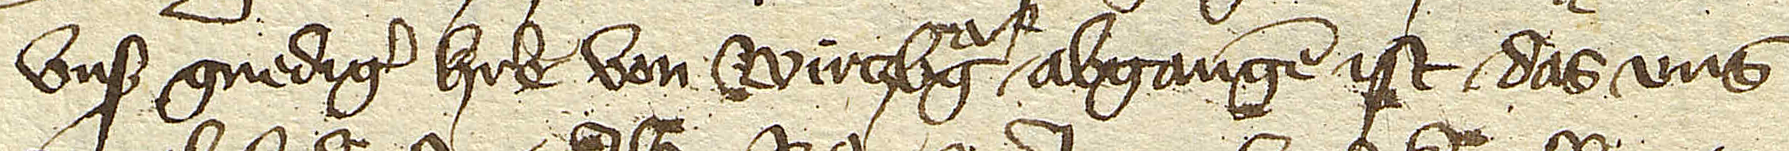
vnſ* gnedig* hr*e von wircʒb*g / abgange* iſt / das vns
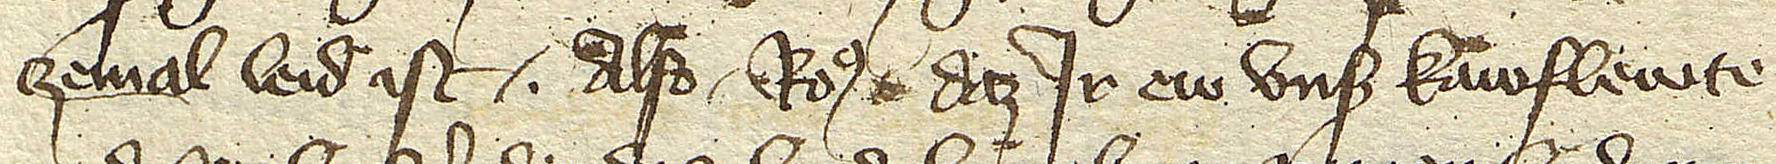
cʒemal leid iſt / . Alſo / Ro* daʒ Ir ew vnſ* kawflewte
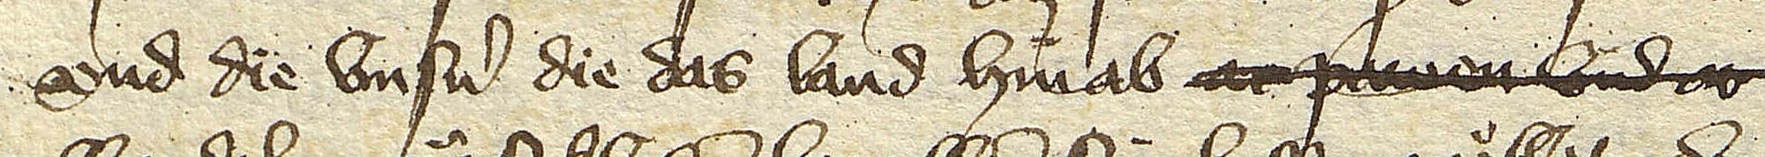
vnd die vnſn* die das land hinab ar pawen vnd ar
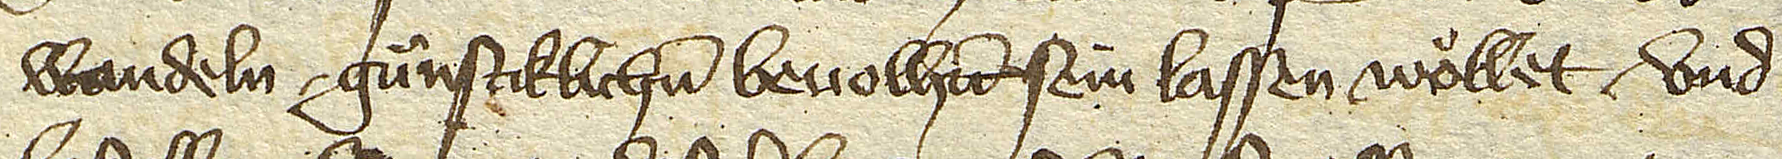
wandeln / günſtiklichn* beuolhn* ſein laſſen wöllet / vnd
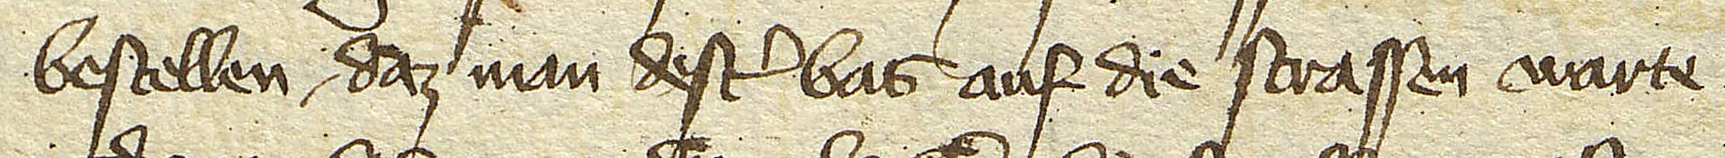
beſtellen / daʒ man deſt* bas auf die ſtraſſen warte
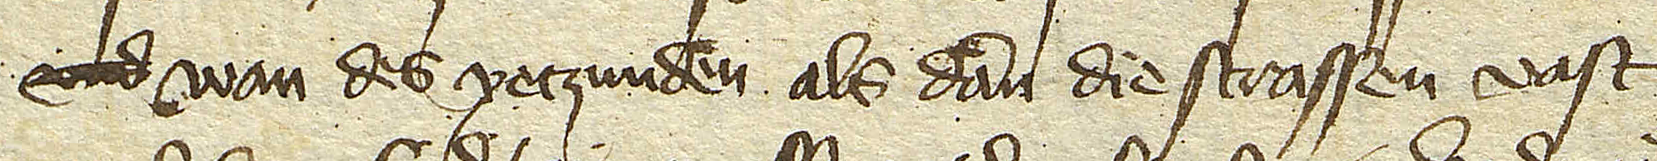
vnd wan des yecʒunden als dan* die ſtraſſen vaſt
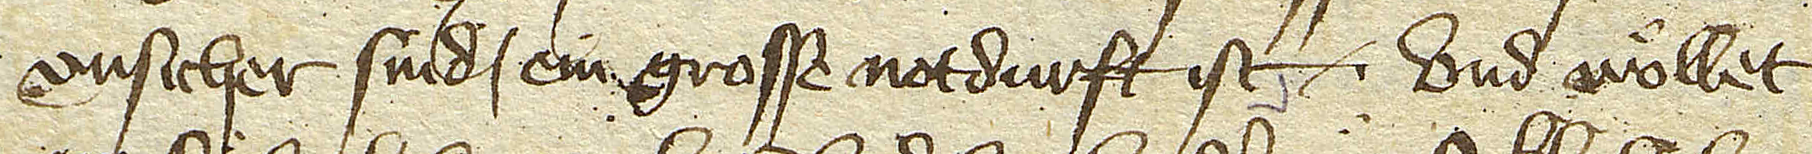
vnſicher ſind ein groſſe notdurft iſt / . vnd wöllet
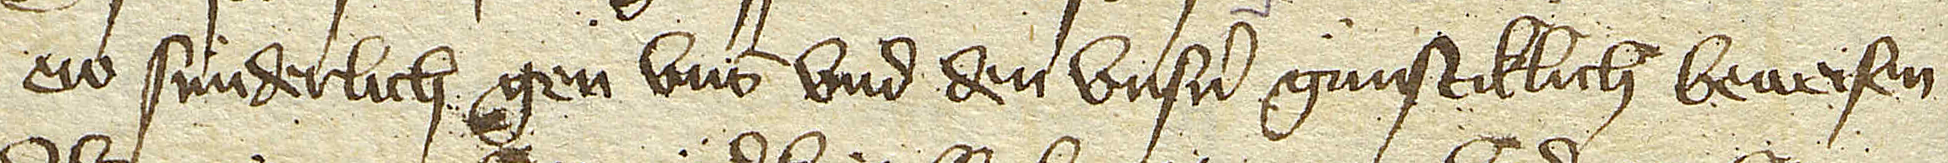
ew ſünderlich gen vns vnd den vnſn* günſtiklich beweiſen
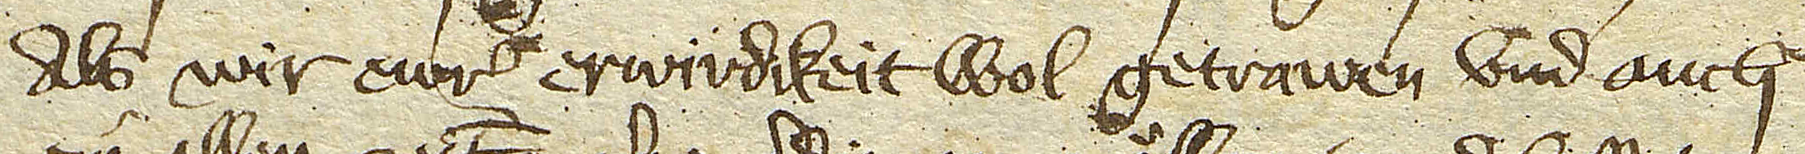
Als wir ewr* erwirdikeit wol getrawen vnd auch
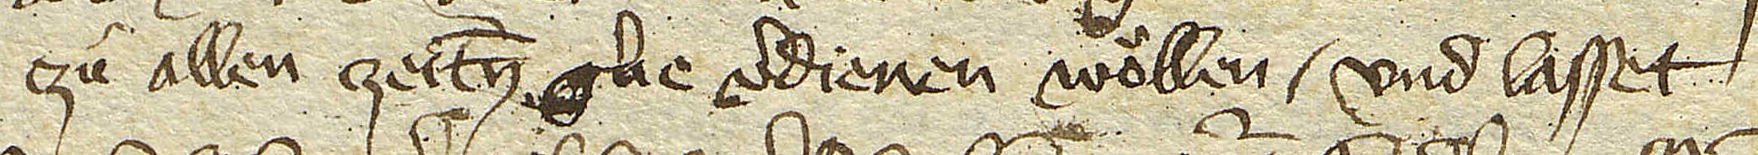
cʒü allen cʒeitn* g*ne v*dienen wöllen / vnd laſſet
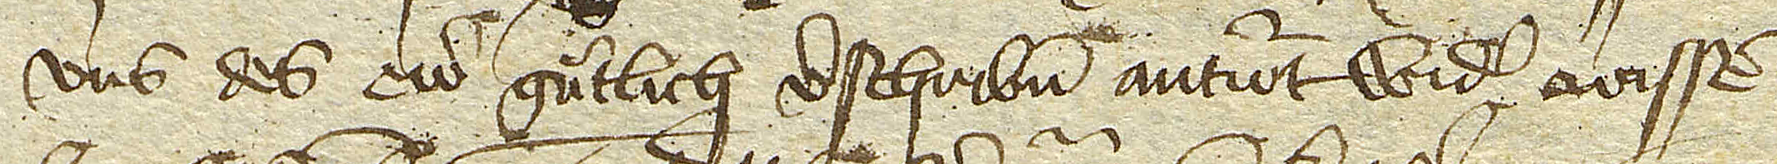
vns des ew* gütlich v*ſchribn* antwt* wid* wiſſe*
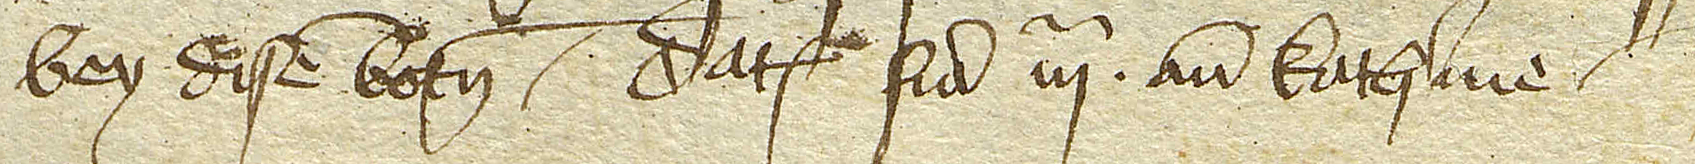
bey diſe* botn* / Dat* fia* iii* . an* kath*ine /
